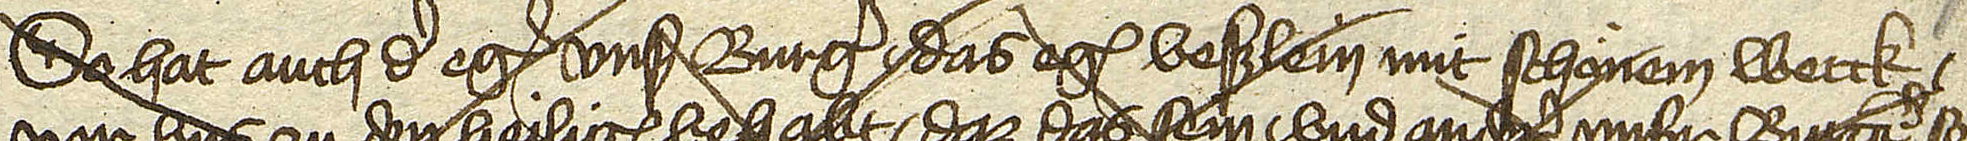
So hat auch d* eg* vnſ* Burg* / das eg* veſʒlein mit ſchönem werck /
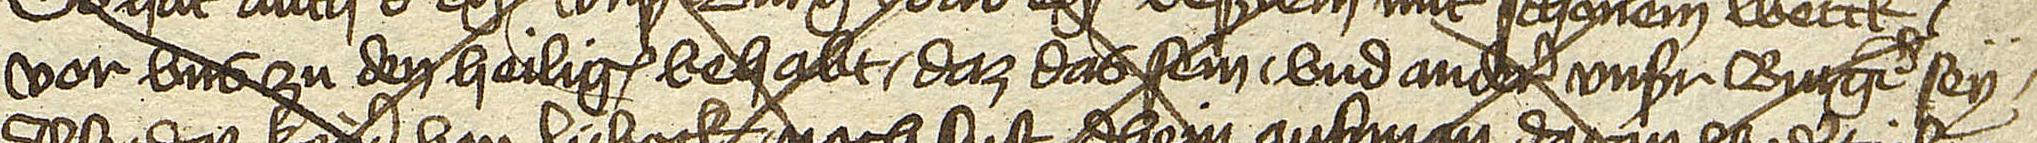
vor vns cʒu den heilig* behabt / daʒ das ſein / vnd ander* vnſ*r Burge* ſey /
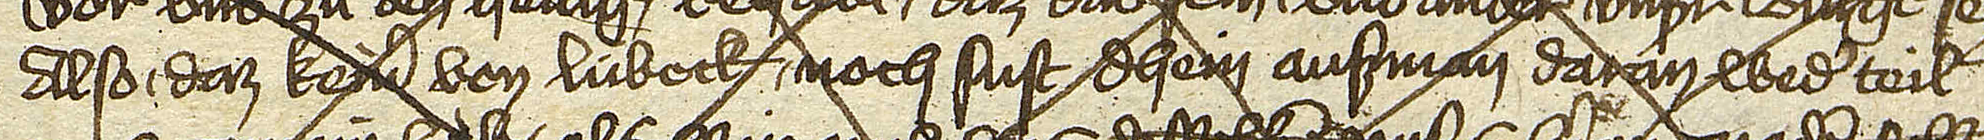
Alſo / daʒ kein* von lübeck / noch ſuſt dhein auſʒman daran wed* teil
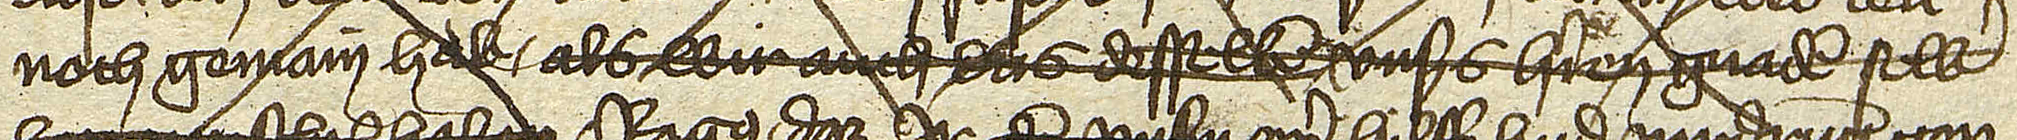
noch gemain hab / als wir auch das deſſelbe* vnſ*s h*ren gnade* ſelb*
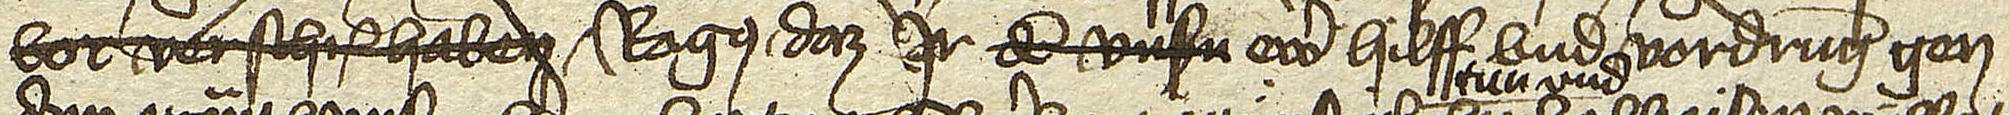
vor verſchr* haben / Rog* / daʒ Ir d* vnſ*n ew* hilff vnd vordrug gen
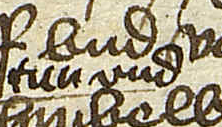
tun vnd
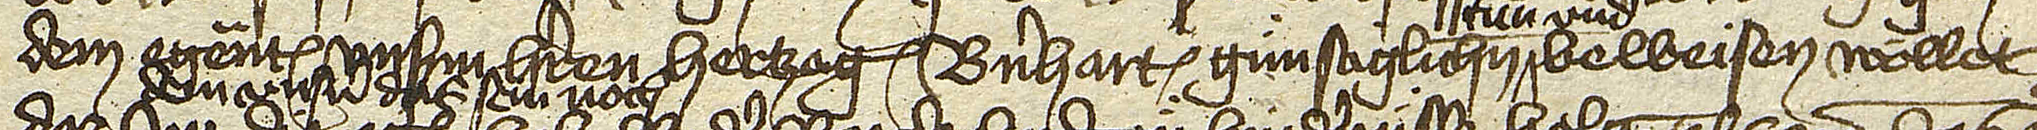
dem egent* vnſ*m h*ren hertʒog Bn*hart* günſtiglichn* beweiſen wöllet
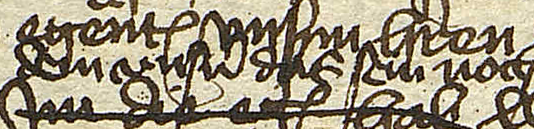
den vnſn* das ſein noch
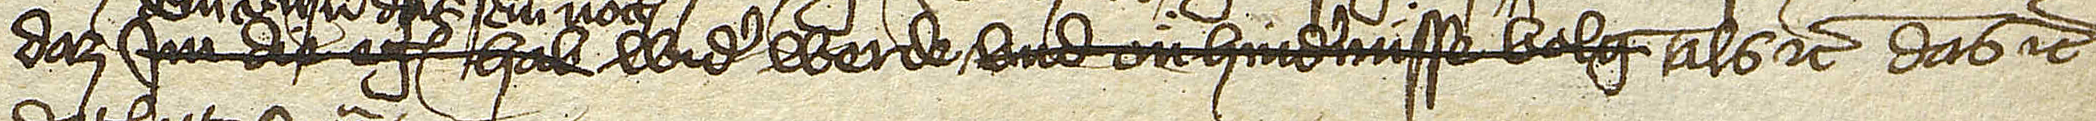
daʒ Im die eg* hab wid* werde / vnd önhind*nüſſe volg / als ec* das ec*
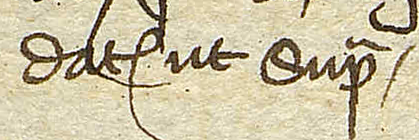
dat* ut Sup* /
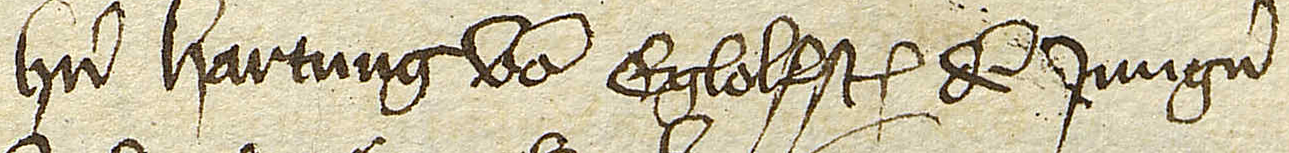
hn* hartung vo* Eglolfſt* d* Iungn*
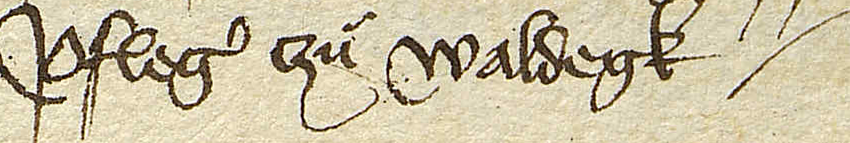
Pfleg* cʒü waldegk* /
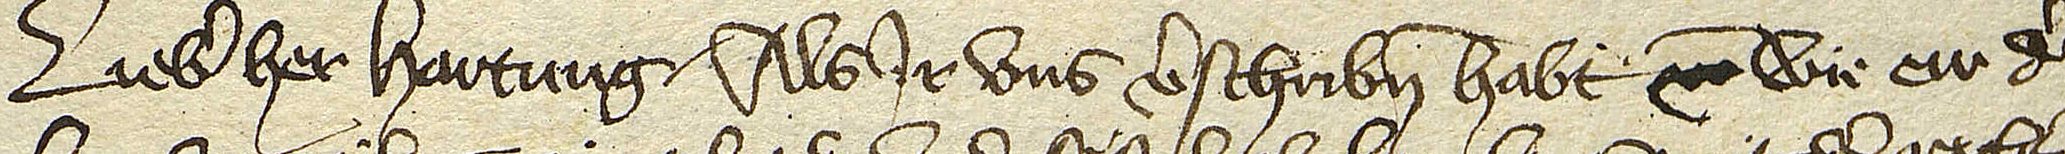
Lieb* her hartung / Als Ir vns v*ſchribn* habt vo* wir ew d*
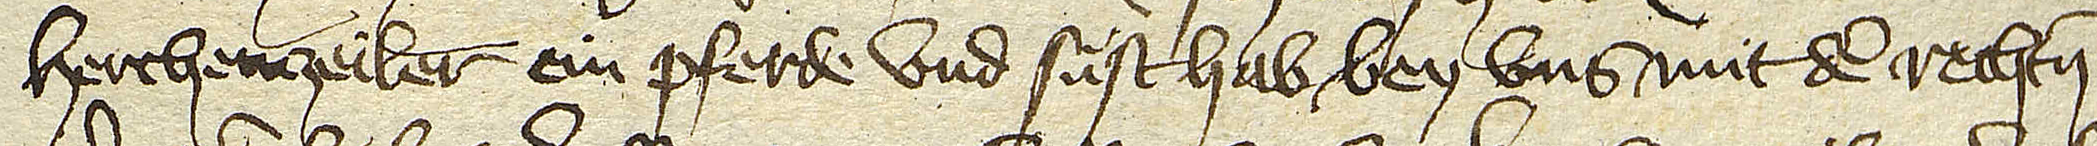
herchencʒeiler ein pferde vnd ſüſt hab / bey vns mit d* rechtn*
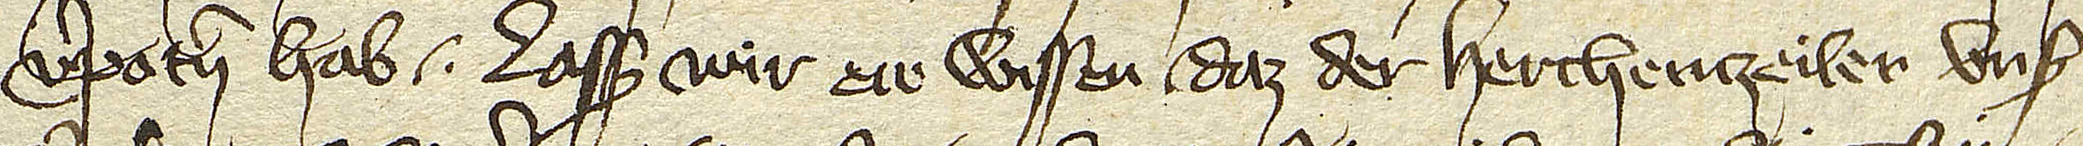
v*potn* hab / . Laſſ* wir ew wiſſen / daʒ der herchencʒeiler vnſ*
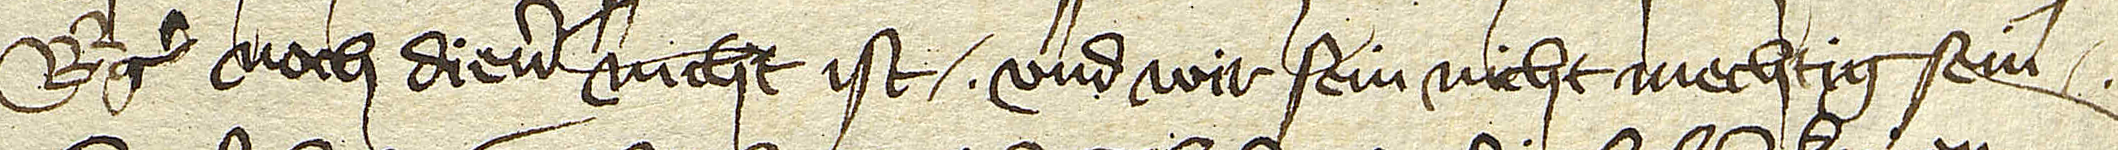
B*g* noch dien* nicht iſt / . vnd wir ſein nicht mechtig ſein / .
